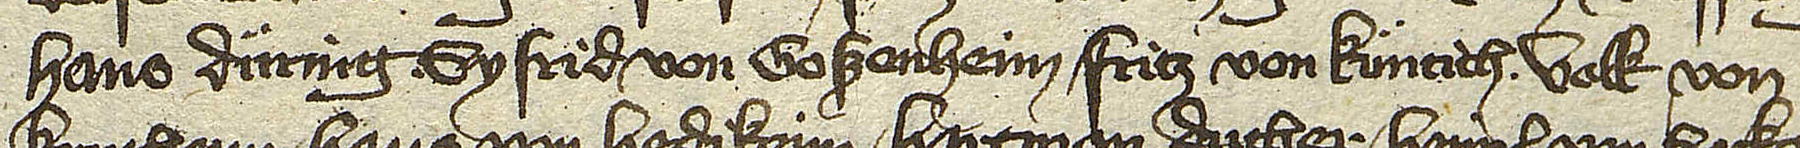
hans düring . Syfrid von Goſʒenheim / Fricʒ von küntich . Volk von
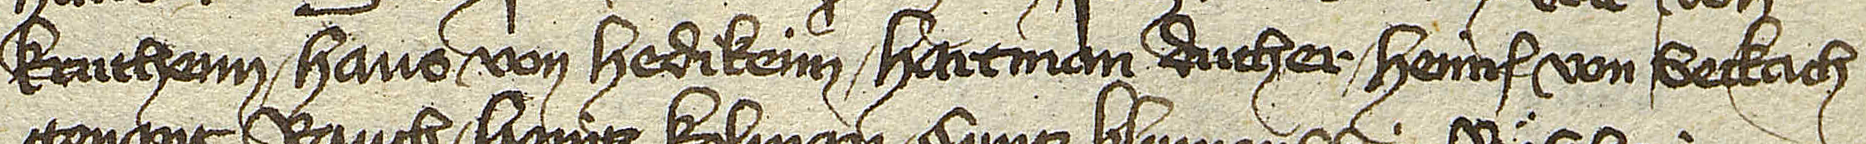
krutheim / hans von hedikeim / hartman ducher / heinr* von Seckach
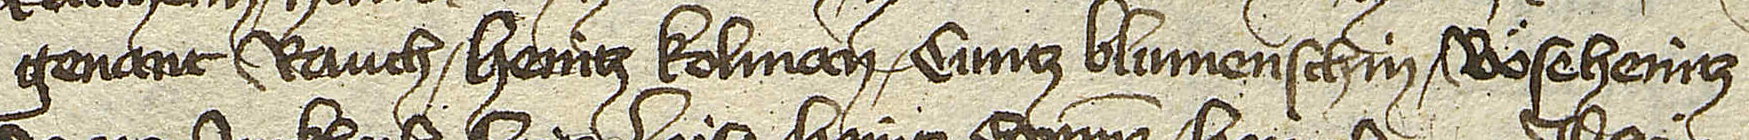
genant Rauch / heincʒ kolman / Cuncʒ blumenſchin / Böſeheincʒ
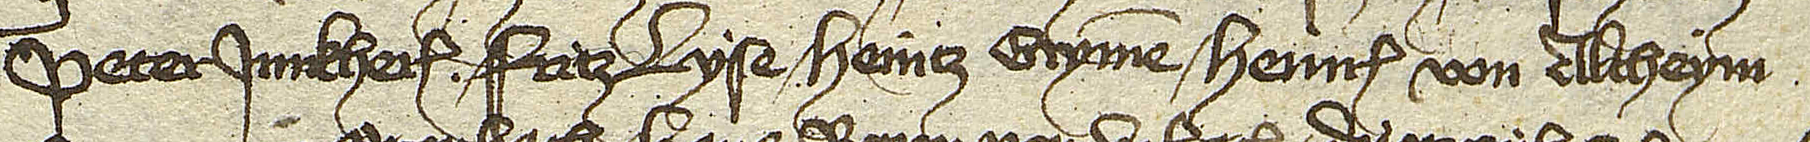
Peter Imkher* . / Fricʒ Lyſe / heincʒ Gryme* / heinr* von Altheym
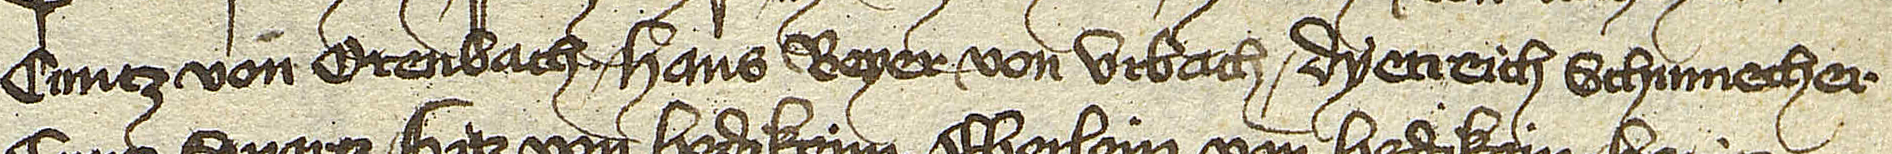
Cuncʒ von Orenbach . / hans Beyer von vrbach / dyetreich Schumecher
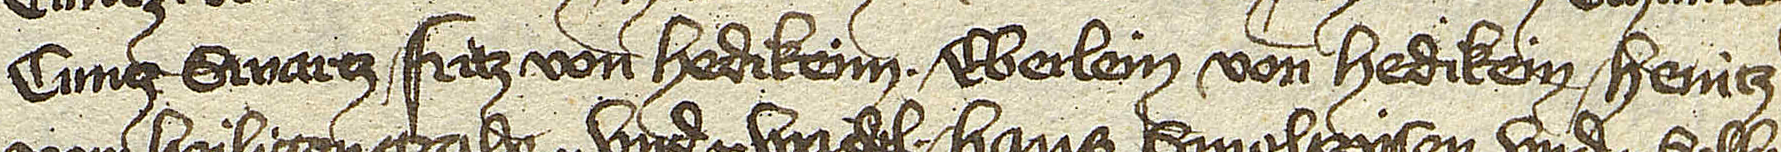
Cuncʒ Swarcʒ / Fricʒ von hedikeim . / Eberlein von hedikeim / heincʒ
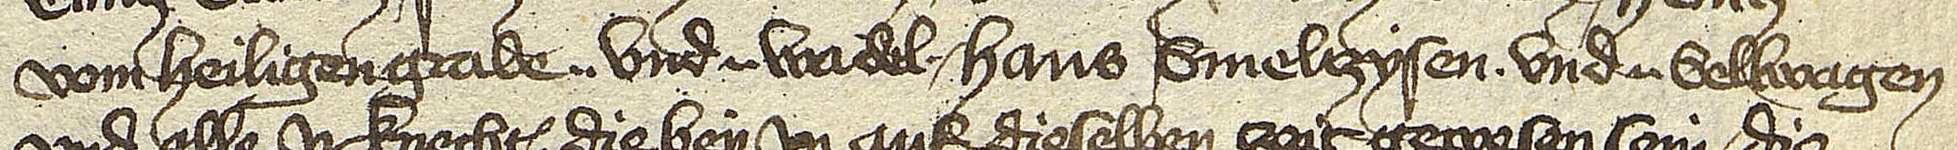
vom heiligen grabe ~ vnd ~ wadel . / hans Smelcʒyſen vnd ~ Sellwagen
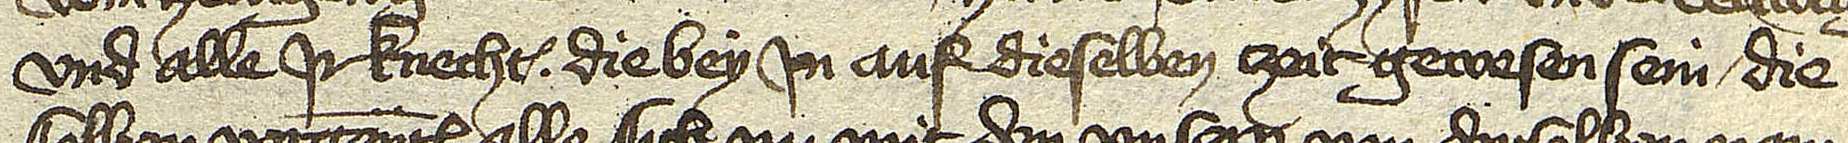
vnd alle Ir knecht* . die bey In auf dieſelbn* cʒeit geweſen ſein / die
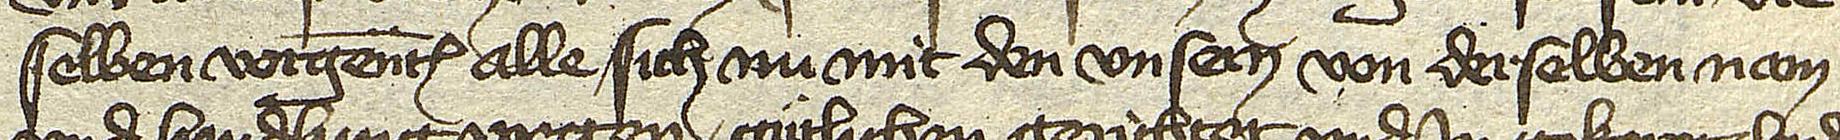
ſelben vorgen*t* alle ſich nu mit den vnſern von derſelben nam
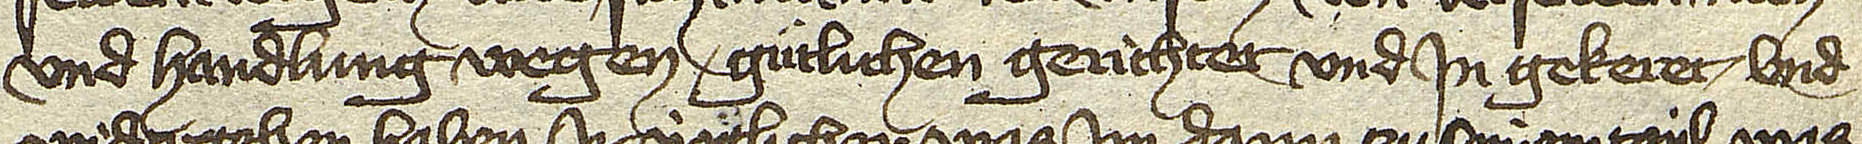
vnd handlung wegen / gütlichen gerichtet vnd In gekeret vnd
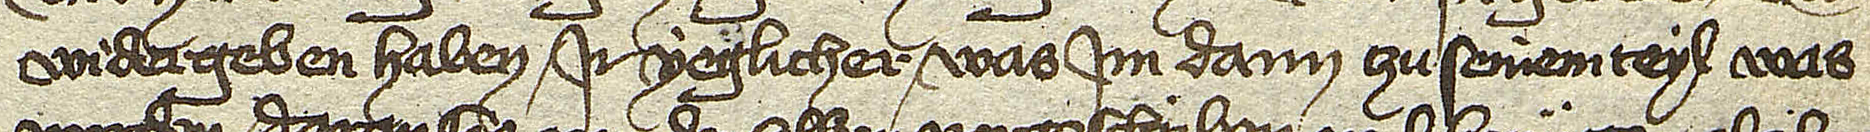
widergeben haben / Ir yeglicher / was Im dann cʒuſeinen teyl was
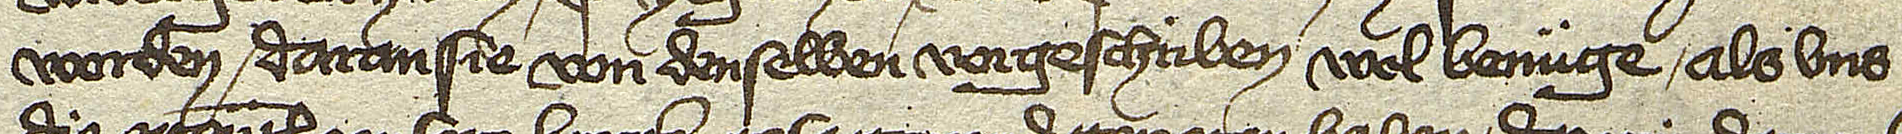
worden / daran ſie denſelben vorgeſchriben wol bemüge / als vns
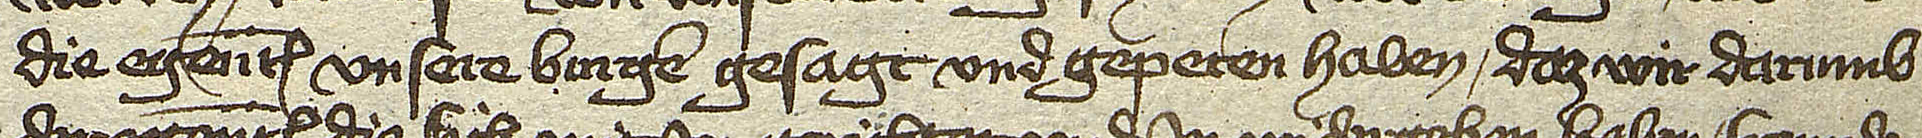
die egen*t* vnſere burge* geſagt vnd gepeten haben / daʒ wir darumb
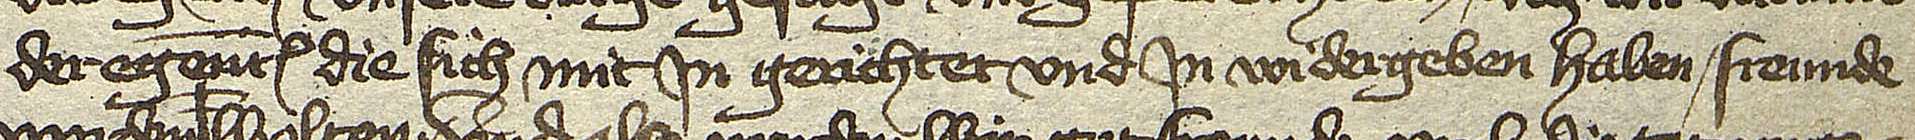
der egen*t* die ſich mit In gerichtet vnd In widergeben haben / freunde
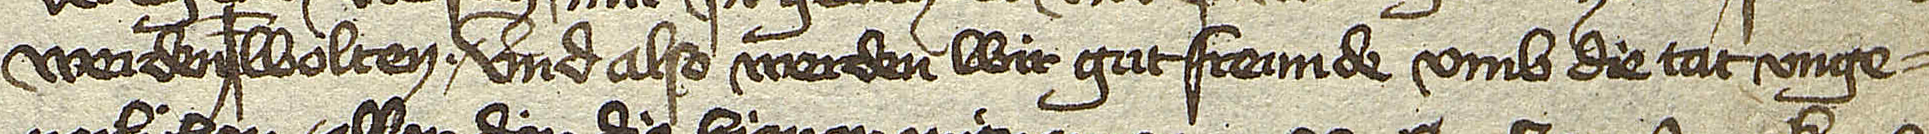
werden wolten / vnd alſo werden wir gut freunde vmb die tat vnge =
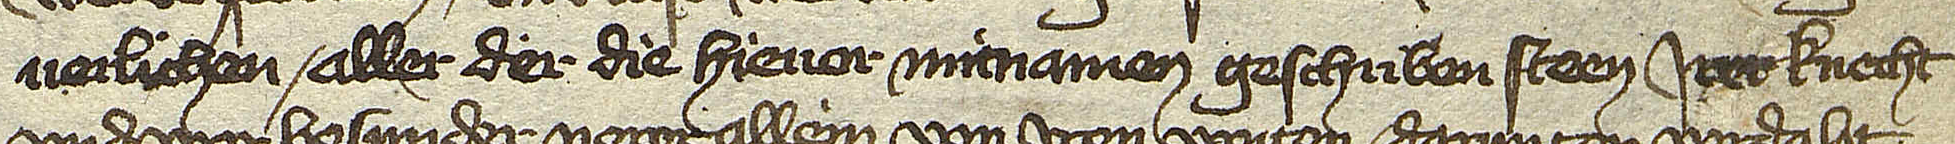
uerlichen / aller der die hieuor mitnamen geſchriben ſteen Irer knecht
